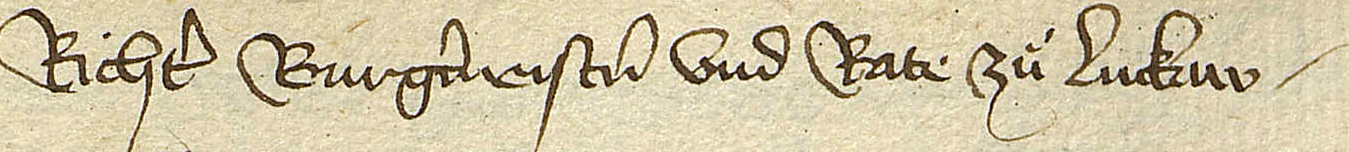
Richt* Burg*meiſtn* vnd Rats cʒü Luckaw /
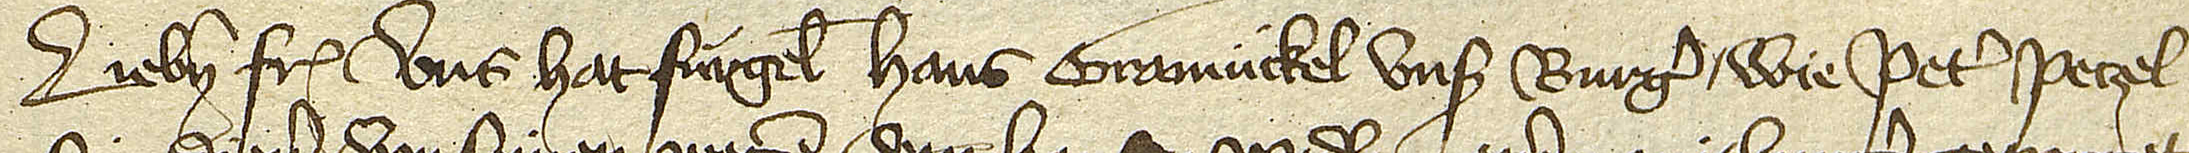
Liebn* fr* / Vns hat fürgel* hans Gramückel vnſ* Burg* / wie Pet* Pecʒel
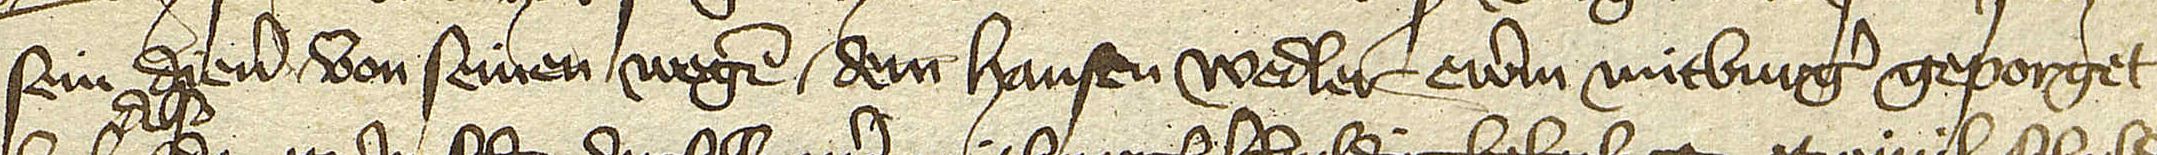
ſein dien* / von ſeinen wege* / dem hanſen Wedler ew*m mitburg* geporget
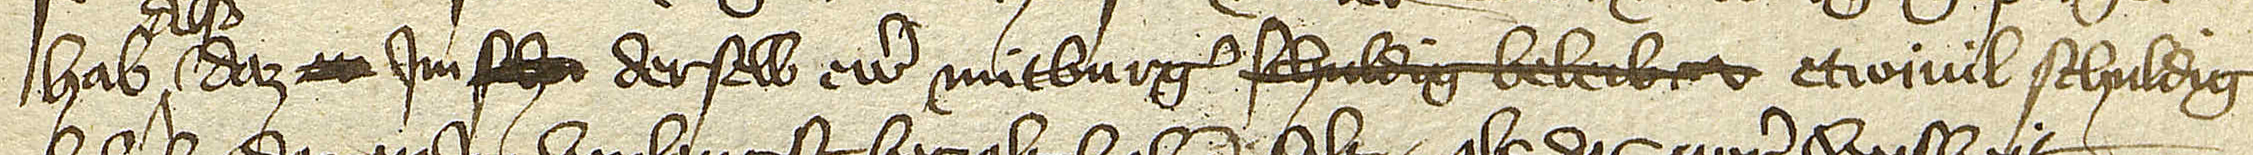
hab / daʒ er Im ſchu derſelb ew* mitburg* ſchuldig beleib / % etwiuil ſchuldig
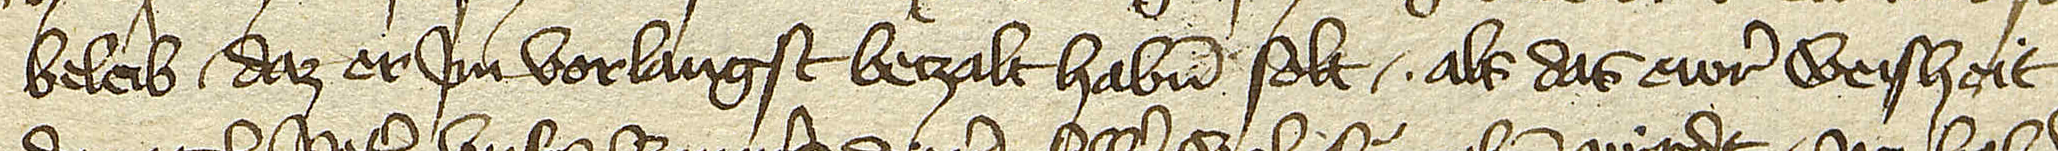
beleib / daʒ er Im vorlangſt becʒalt habn* ſolt / . als das ewr* weiſheit
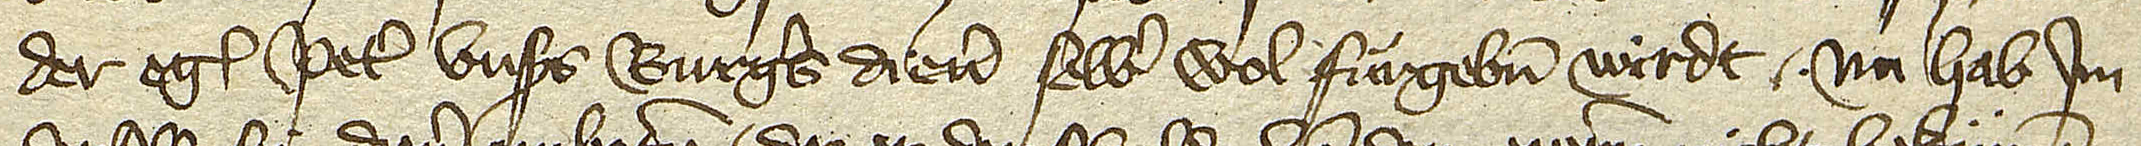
der eg* Pet* vnſ*s Burg*s dien* ſelb* wol fürgebn* wirdt / . Nu hab Im
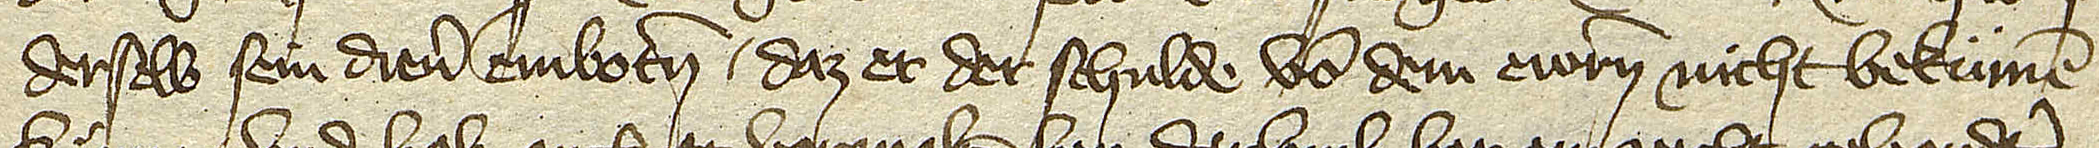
derſelb ſein dien* embotn* / daʒ er der ſchulde vo* dem ewrn* nicht beküme*
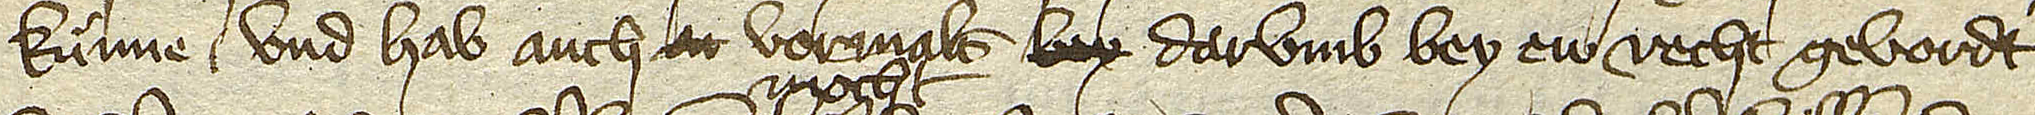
künne / vnd hab auch ar vormals bey darvmb bey ew recht gevordt*
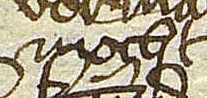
mocht
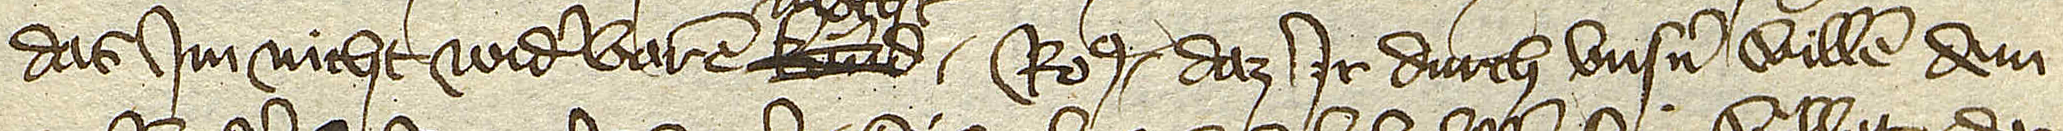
das Im nicht wid*vare* künd / Ro* / daʒ Ir durch vnſn* wille* dem
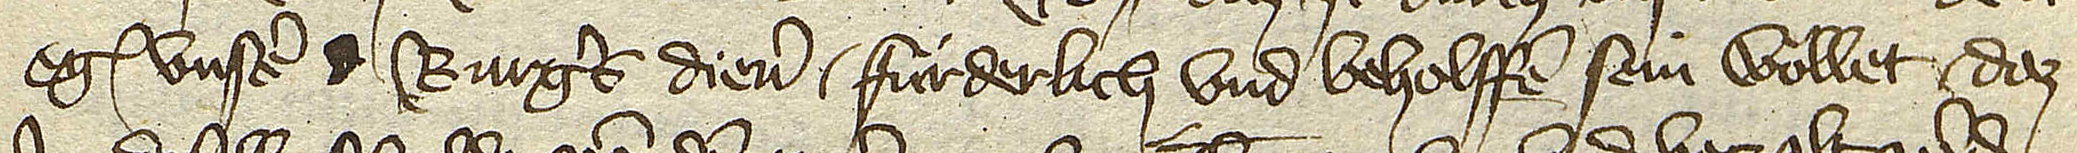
eg* vnſs* d Burg*s dien* / fürderlich vnd beholffe* ſein wöllet / daʒ
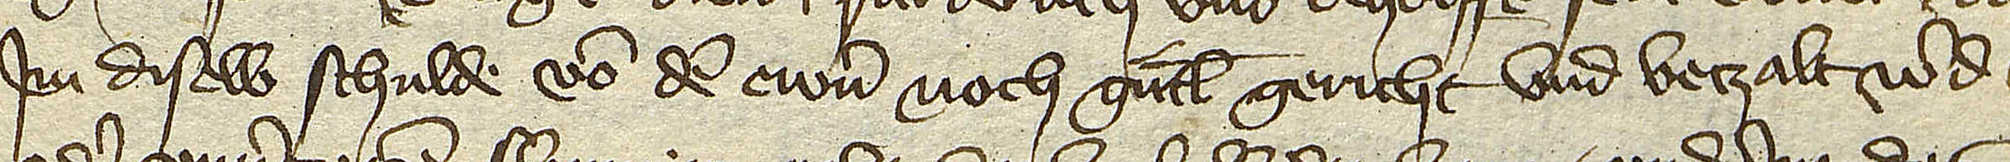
Im diſelb ſchulde vo* d* ewn* noch gütl* gericht vnd becʒalt w*d
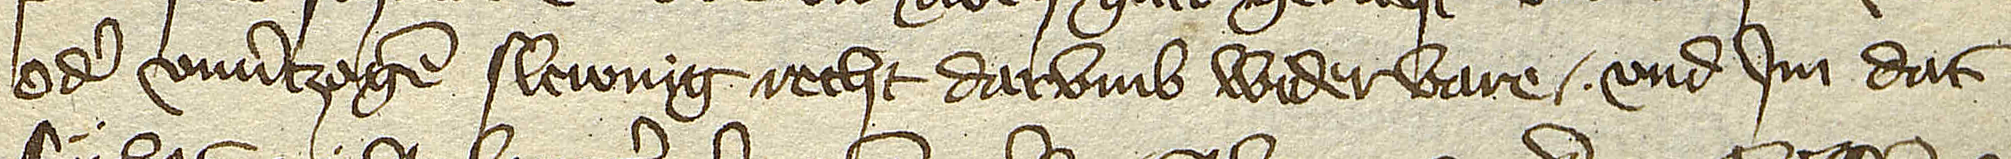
od* vnu*cʒoge* ſlewnig recht darvmb widervare / . vnd Im das
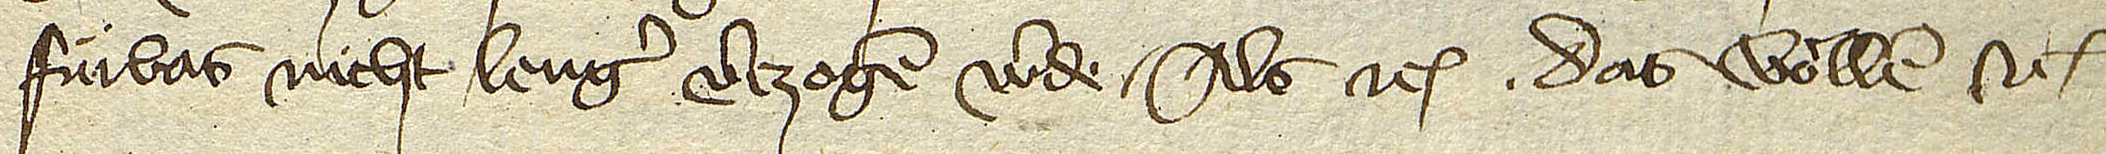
fürbas nicht leng* v*cʒoge* w*de / Als ec* . Das wölle* ec*
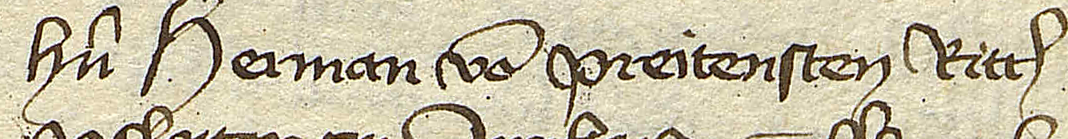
hn* Herman vo* Preitenſten Ritt*
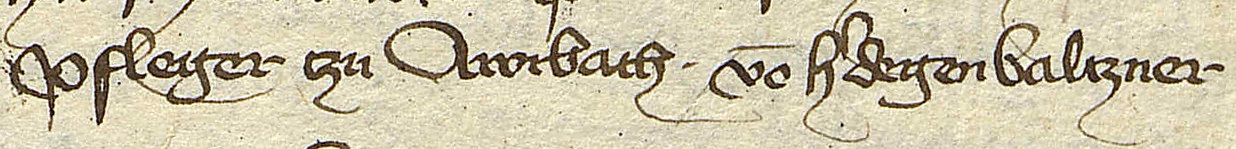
Pfleger cʒu Awrbach vo* h*degen valcʒner
